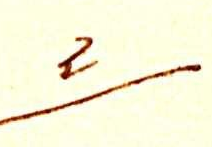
2
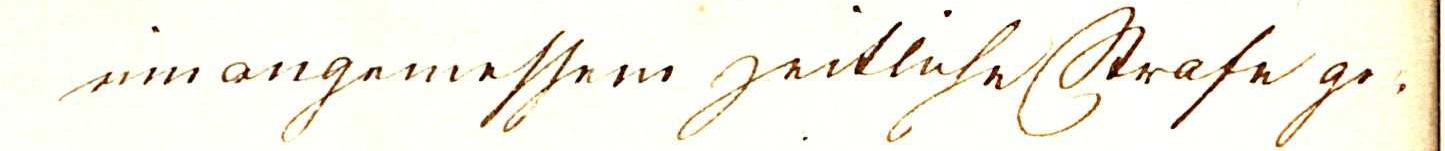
eine angemessene zeitliche Strafe ge¬
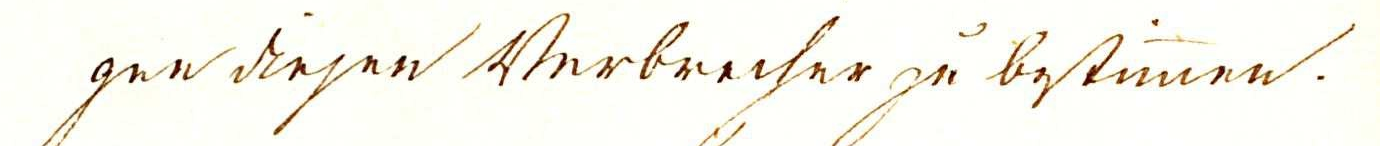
gen diesen Verbrecher zu bestimmen.
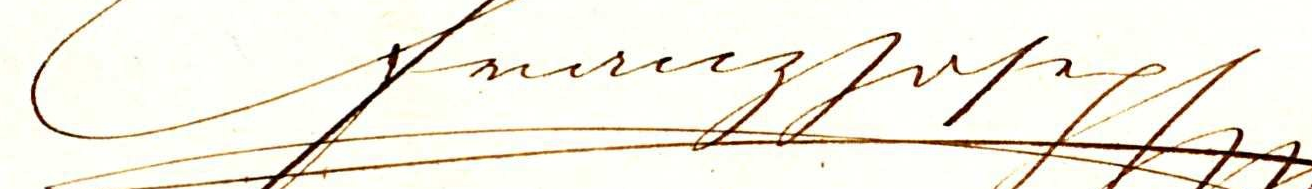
Franz Joseph
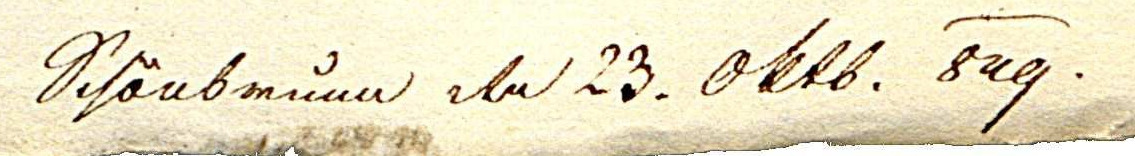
Schönbrunn den 23. Oktb. 849.
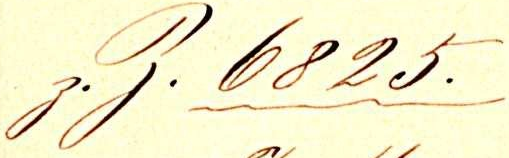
z. Z. 6825.
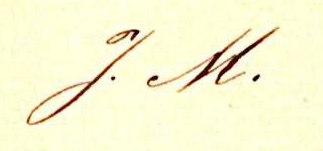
J. M.
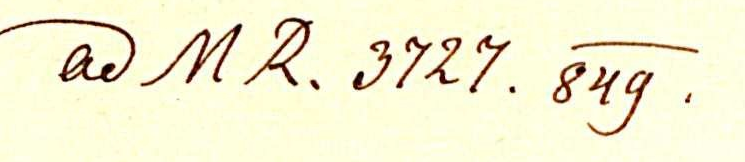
ad M R. 3727. 849.
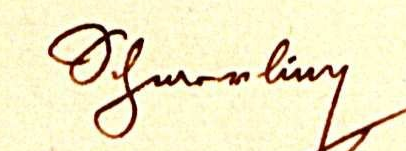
Schwerling
